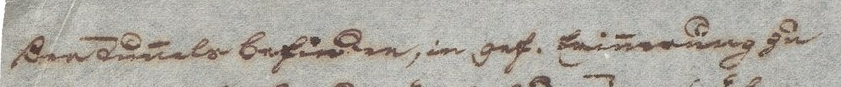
ßen Tunnels befinden, in gef. Erinnerung zu
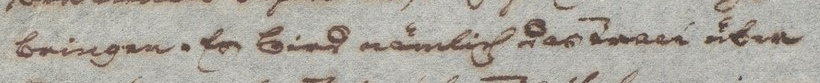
bringen. Es wird nämlich das Tracé über
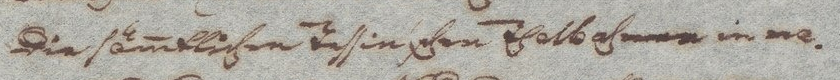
die sämmtlichen Tessin'schen Thalbahnen in na-
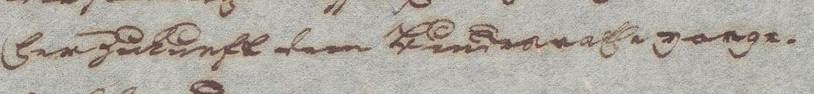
her Zukunft dem Bundesrathe vorge-
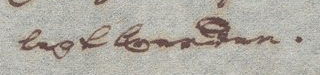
legt werden.
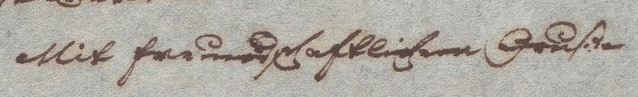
Mit freundschaftlichem Gruße
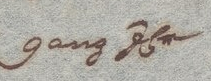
ganz Ihr
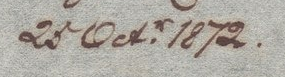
25 Octr 1872.
